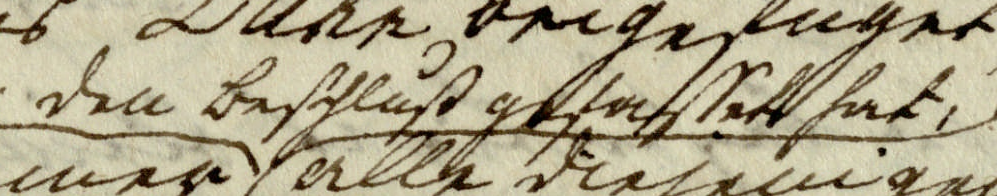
den Beschluß gefasset hat,
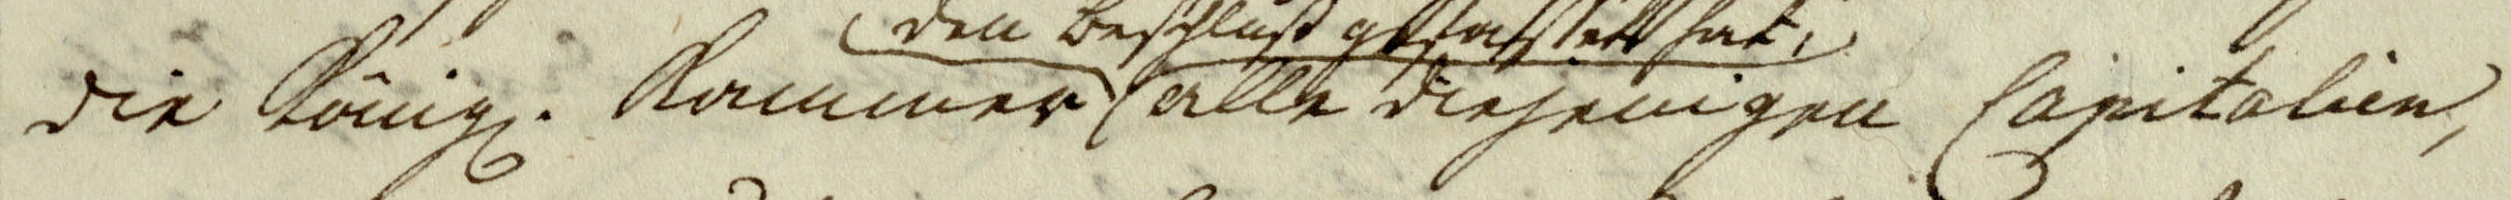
die Königl. kammer alle diejenigen Capitalien,
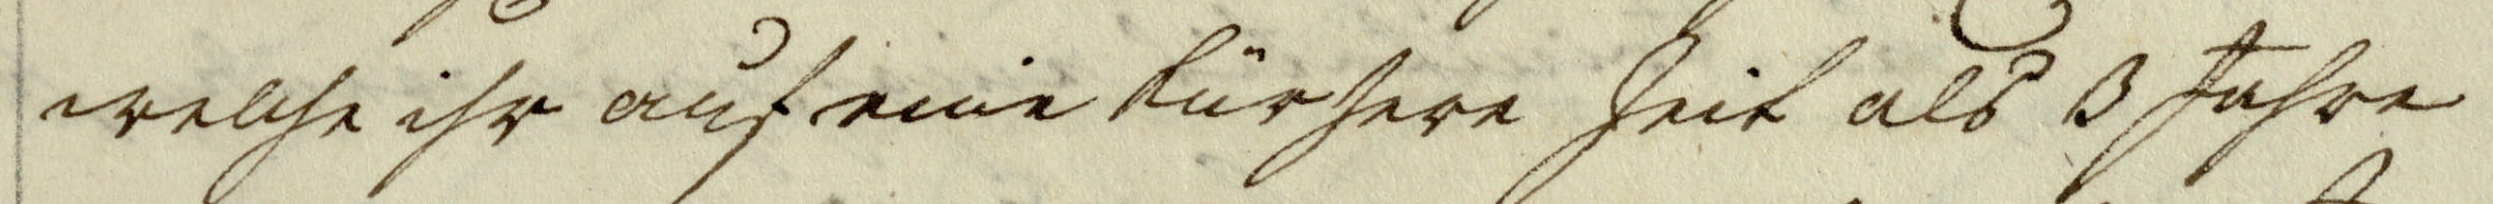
welche ihr auf eine kürzere Zeit als 3 Jahre
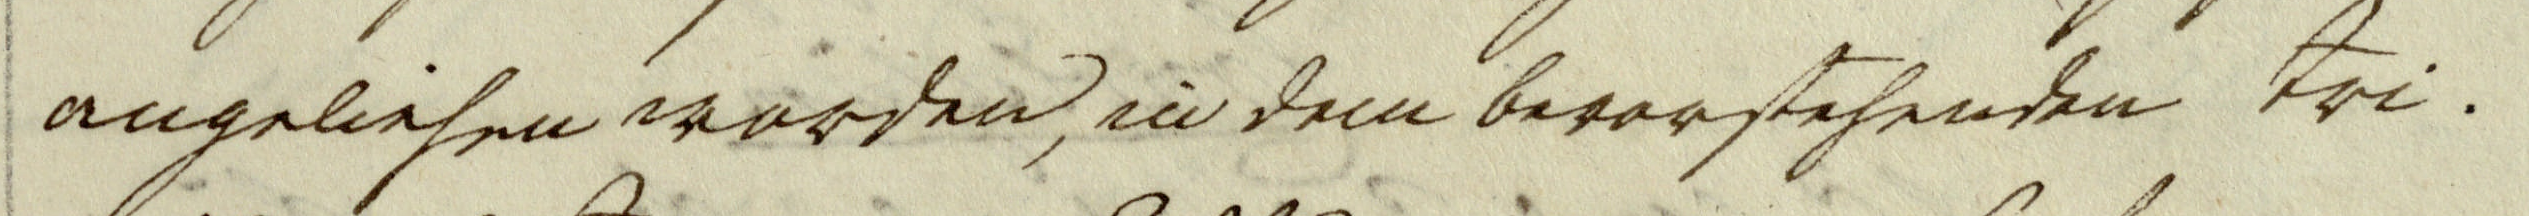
angeliehen worden, in dem bevorstehenden Tri¬
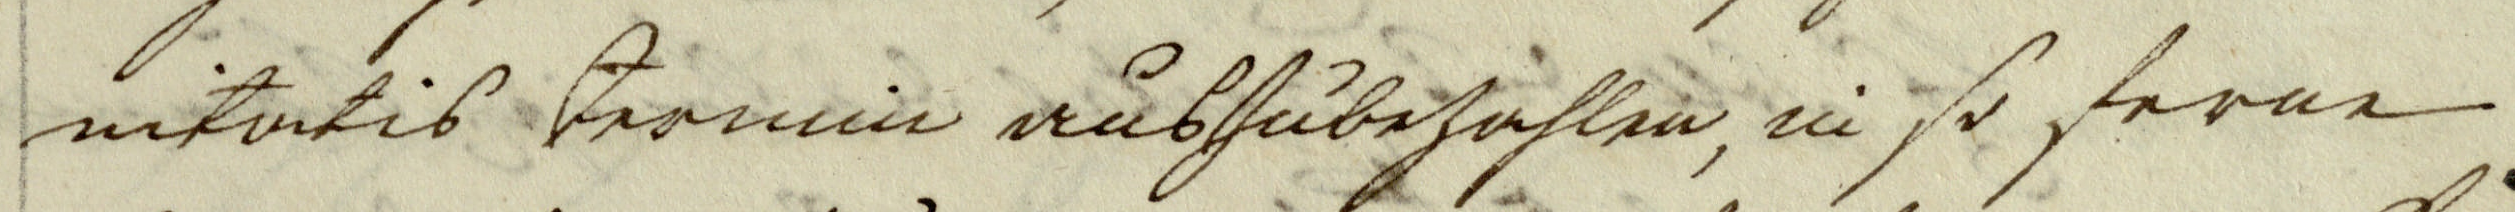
nitatis Termin auszubezahlen, in so fern
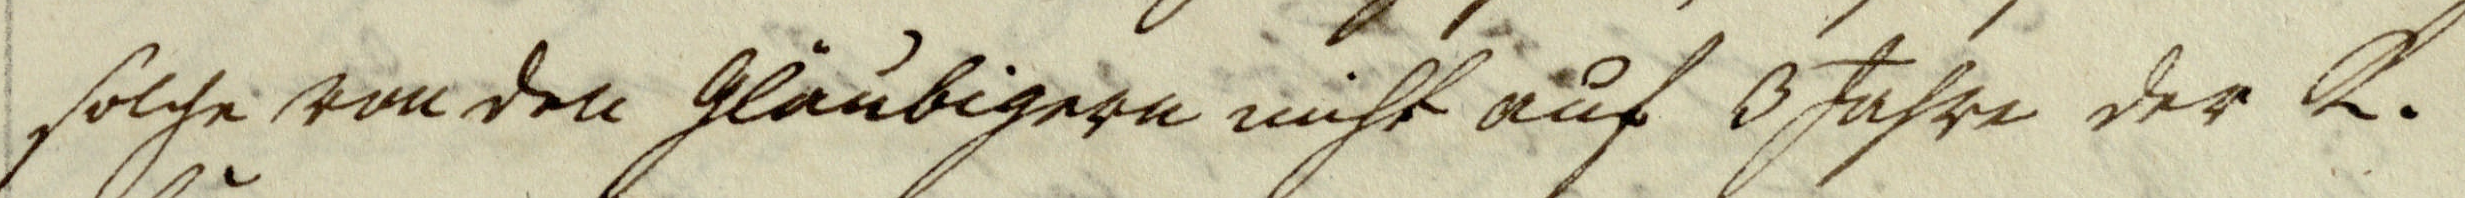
solche von den Gläubigern nicht auf 3 Jahre der K.
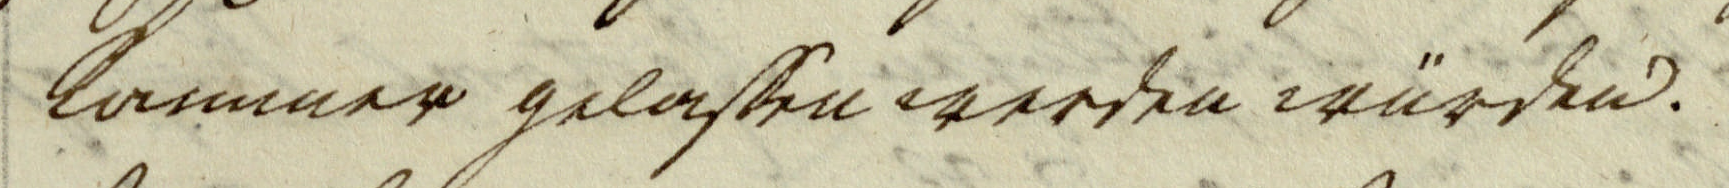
Kammer gelassen werden würden.
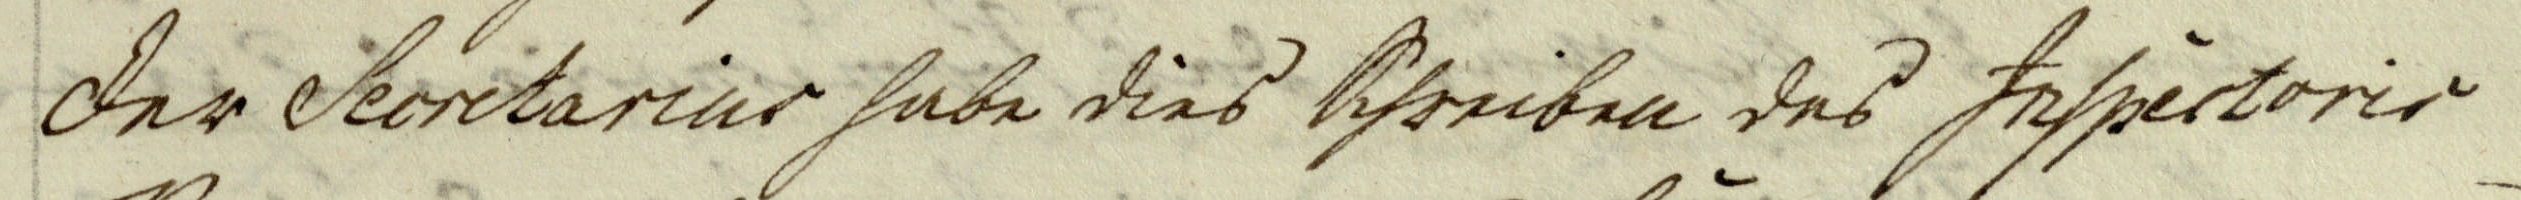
Der Secretarius habe dies Schreiben des Inspectoris
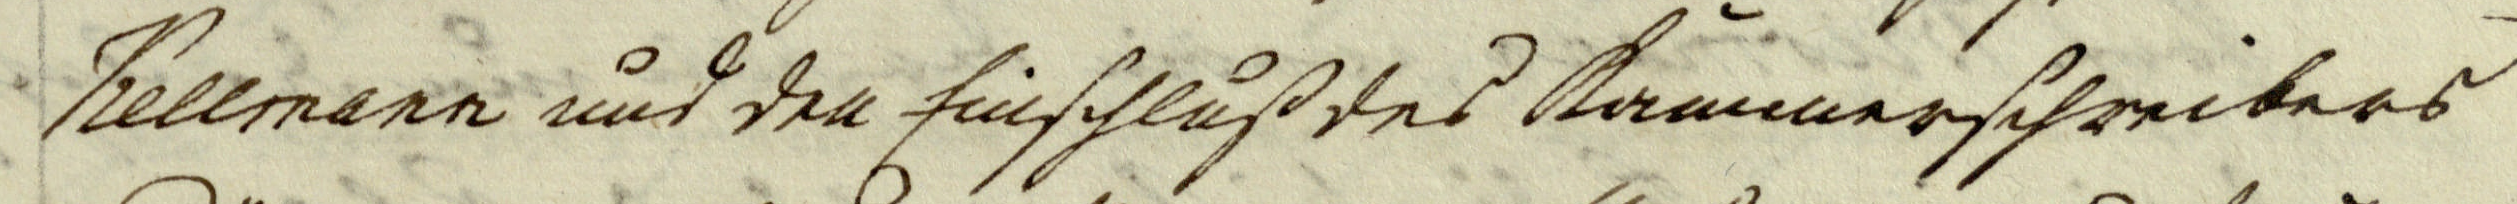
Kellmann und den Einschluß des Kammerschreibers
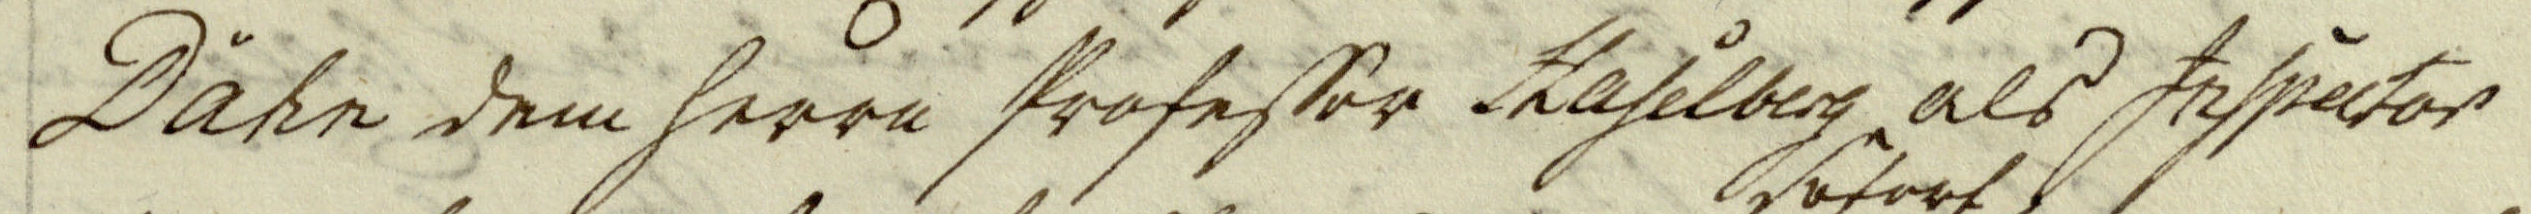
Dähn dem Herrn Professor Haselberg als Inspector
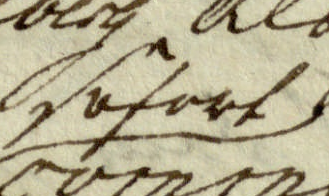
sofort
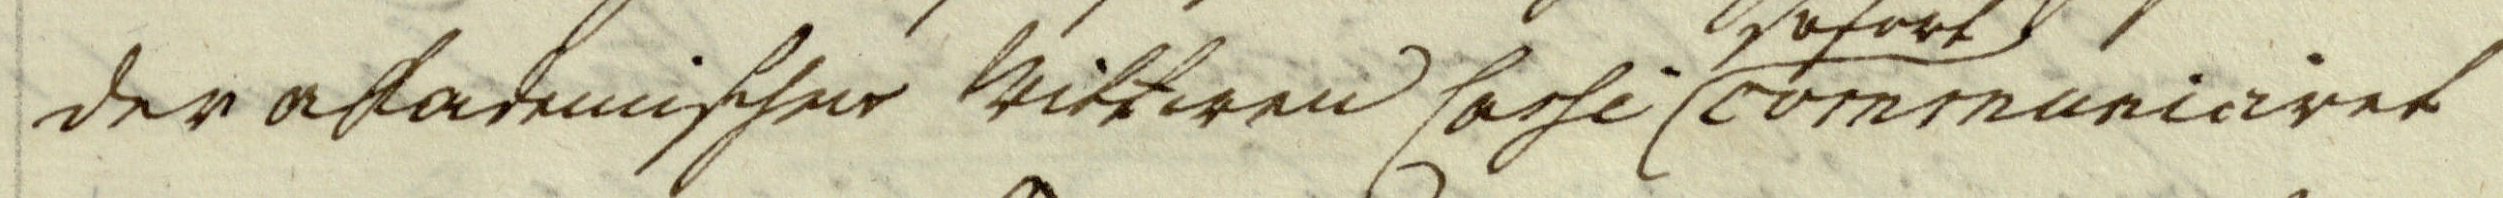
der akademischen Wittwen Casse communiciret
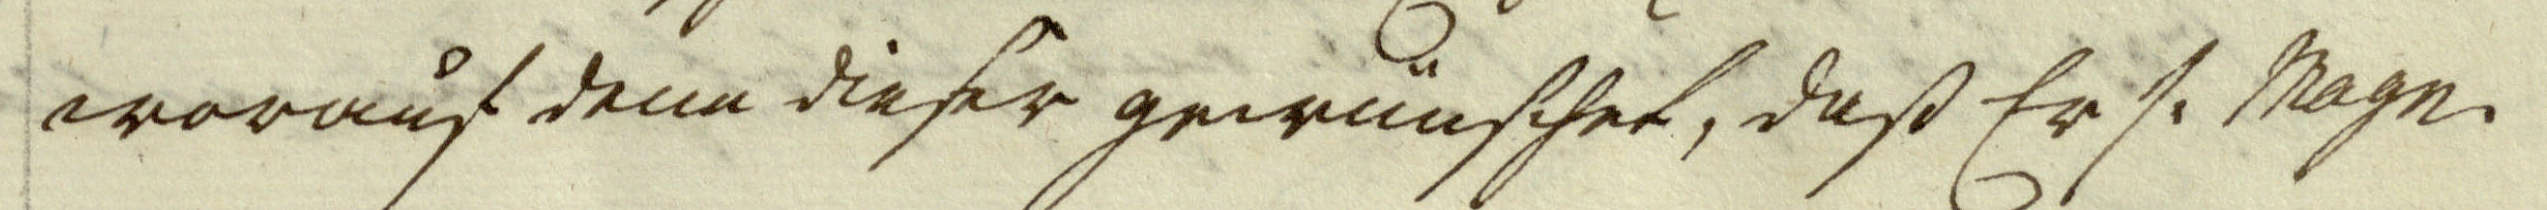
worauf denn dieser gewünschet, daß Er /: Magn.
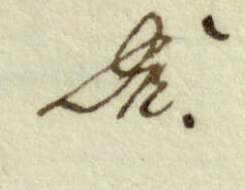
Dn.
